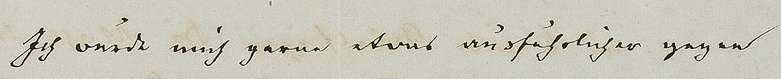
Ich würde mich gerne etwas ausführlicher gegen
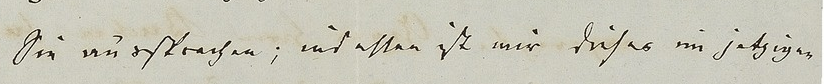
Sie aussprechen; indessen ist mir dieses im jetzigen
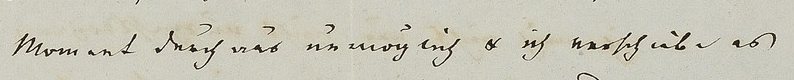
Moment durchaus unmöglich & ich verschiebe es
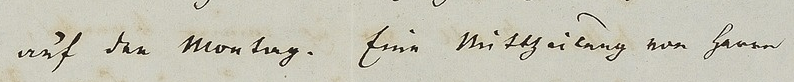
auf den Montag. Eine Mittheilung von Herrn
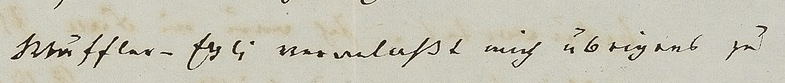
Wäffler-Egli veranlaßt mich übrigens zu
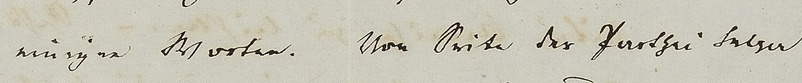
einigen Worten. Von Seite der Parthei Sulzer
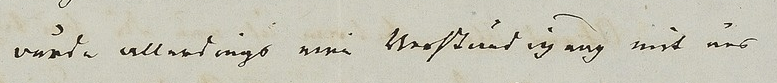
wurde allerdings eine Verständigung mit uns
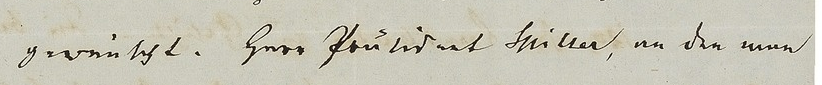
gewünscht. Herr Präsident Spiller, an den man
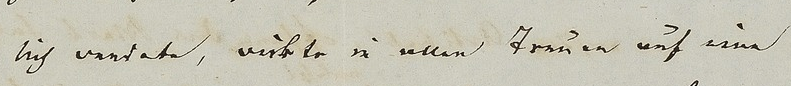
sich wendete, wirkte in allen Treuen auf eine
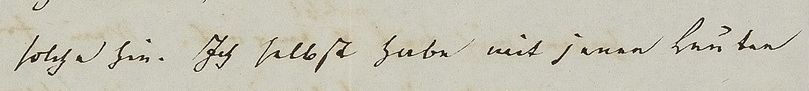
solche hin. Ich selbst habe mit jenen Leuten
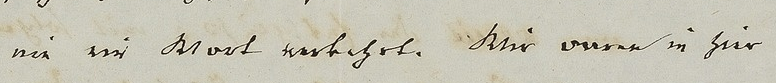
nie ein Wort verkehrt. Wir waren in hier
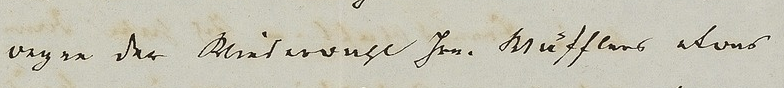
wegen der Wiederwahl Hrn. Wäfflers etwas
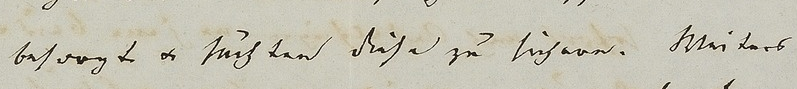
besorgt & suchten diese zu sichern. Weiters
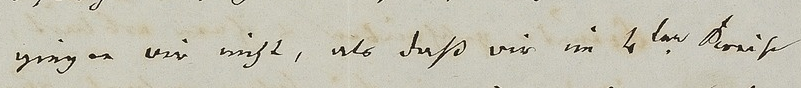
gingen wir nicht, als daß wir im 4ten Kreise
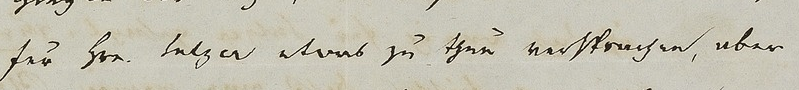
für Hrn. Sulzer etwas zu thun versprachen, aber
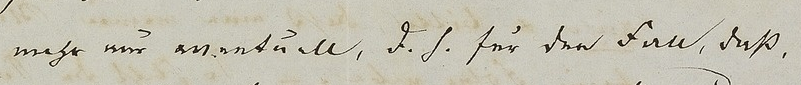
mehr nur eventuell, d. h. für den Fall, daß,
